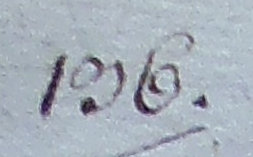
136.
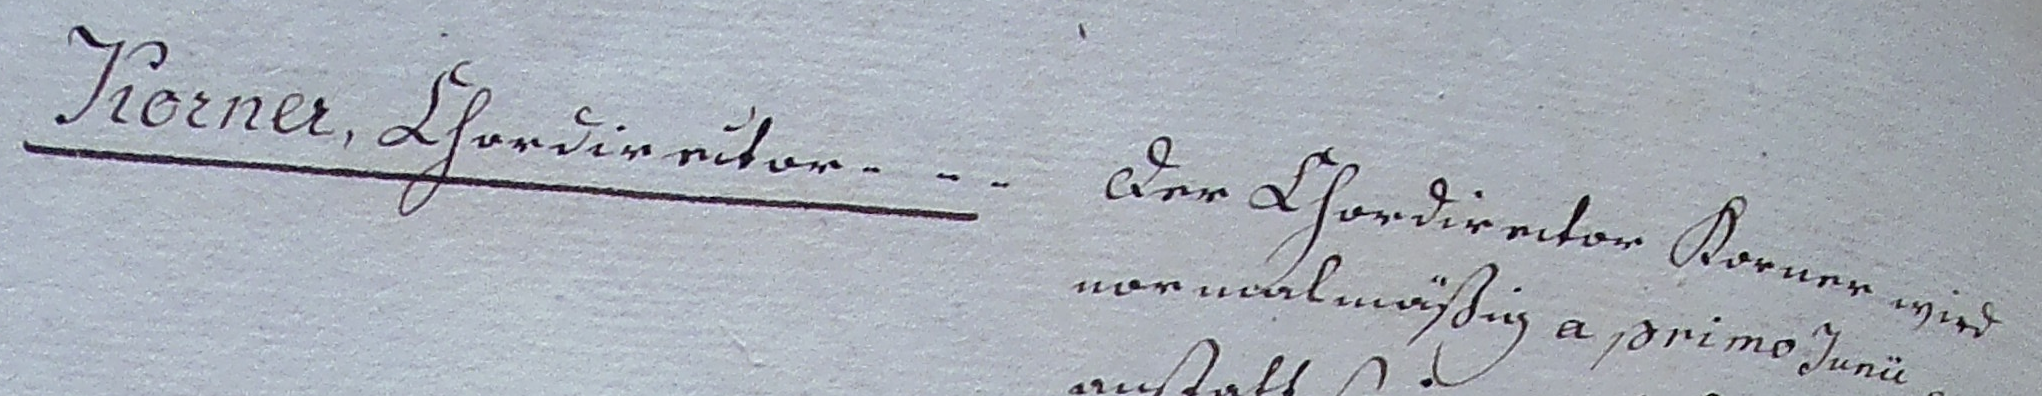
Korner, Chordirector .. .. .. Der Chordirector Korner wird
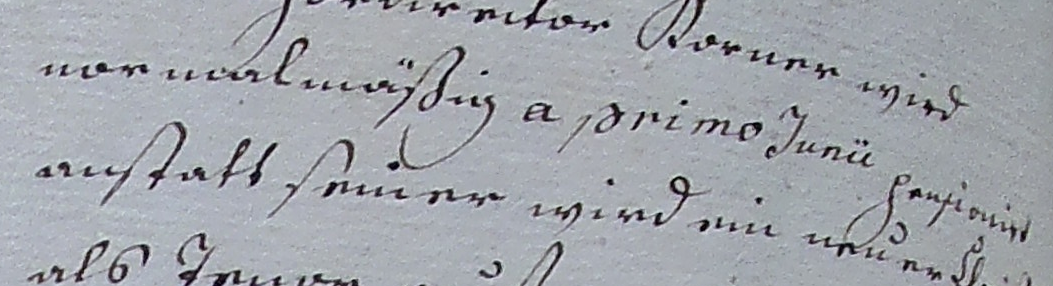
normalmäßig a primo Junii pensionirt
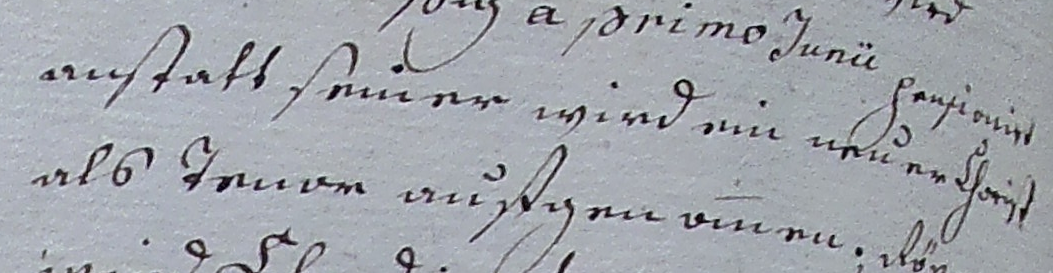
anstatt seiner wird ein neuer Chorist
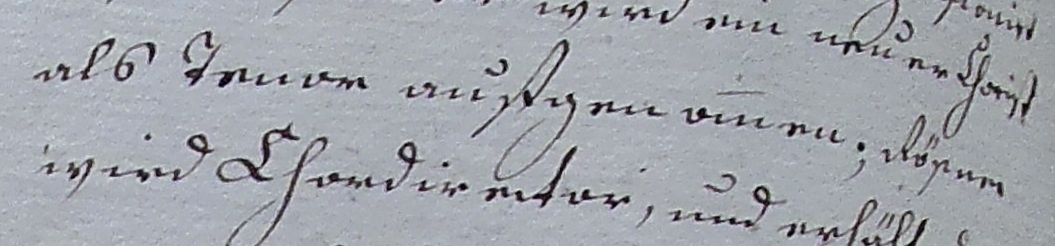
als Tenor aufgenom̅en; Rösner
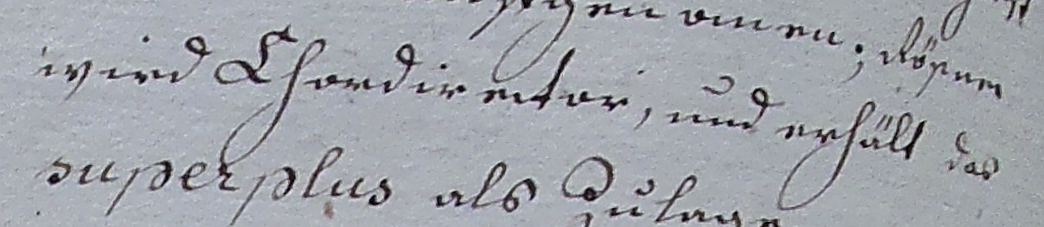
wird Chordirector, und erhält das
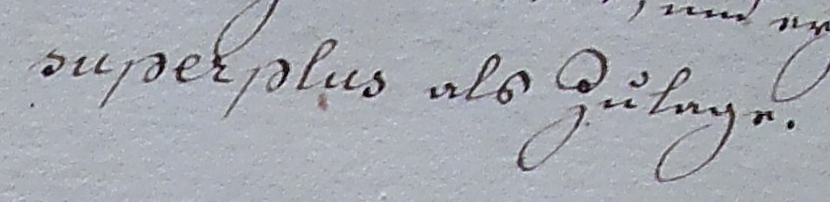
super plus als Zulage.
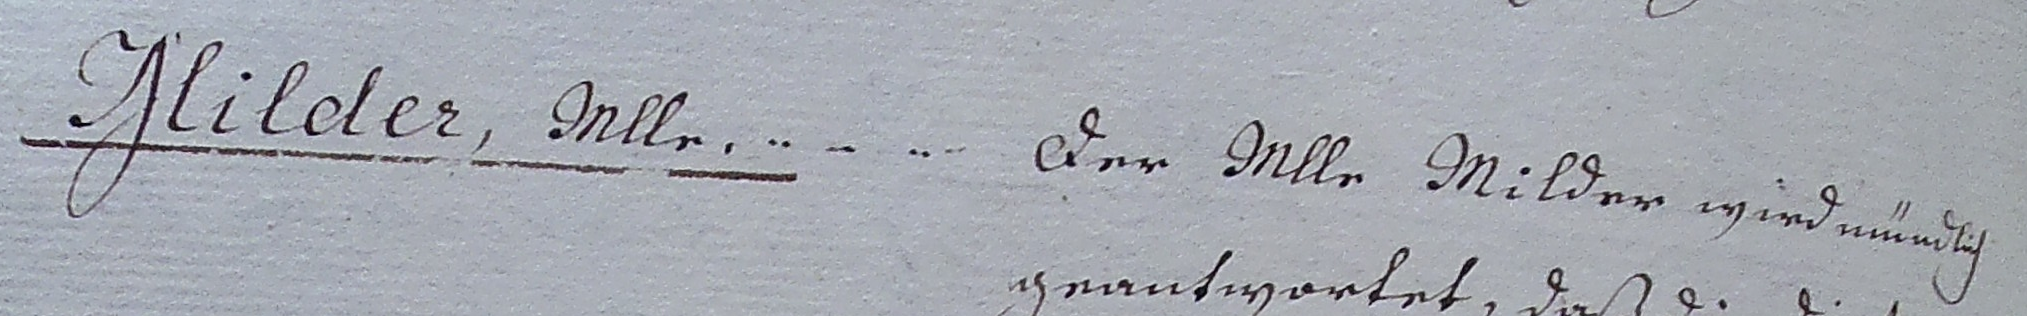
Milder, Mlle. .. .. .. Der Mlle Milder wird mündich
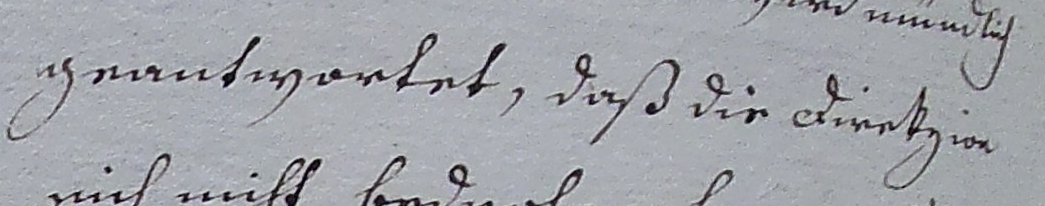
geantwortet, daß die Direkzion
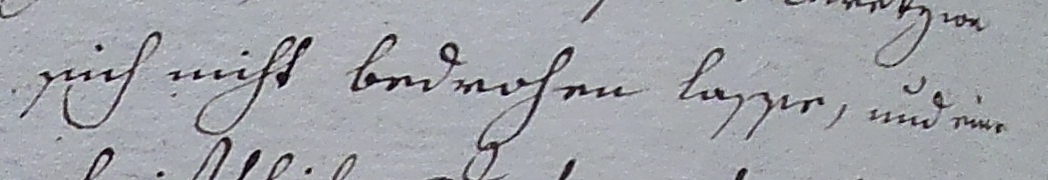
sich nicht bedrohen lasse, und eine
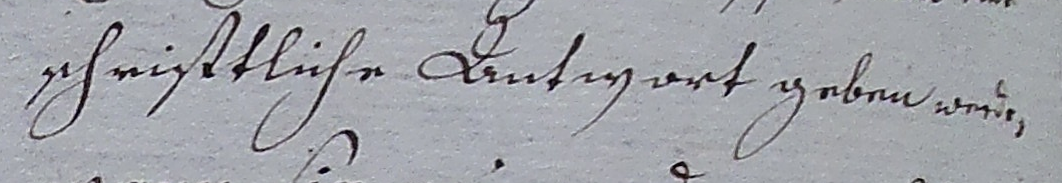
schriftliche Antwort geben werde,
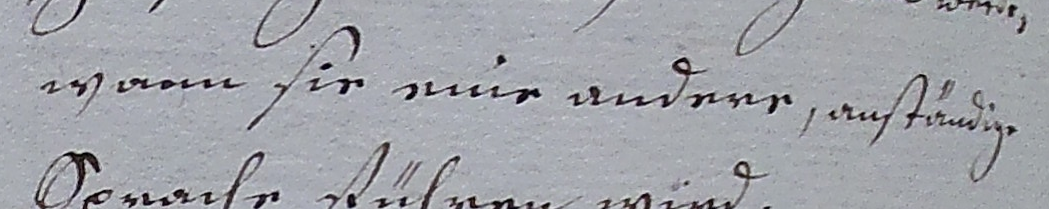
wann sie eine andere, anständige
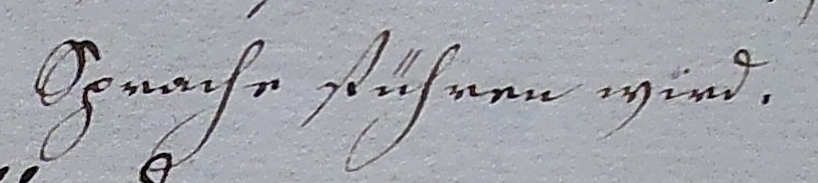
Sprache führen wird.
